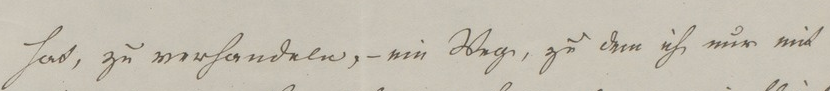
hat, zu verhandeln, – ein Weg, zu dem ich nur mit
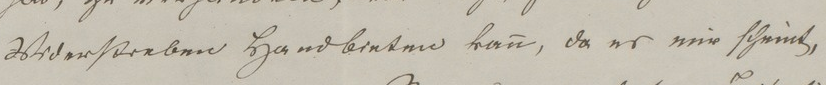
Widerstreben Hand bieten kann, da es mir scheint,
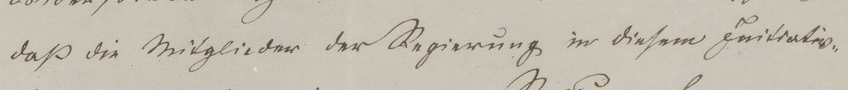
daß die Mitglieder der Regierung in diesem Initiativ-
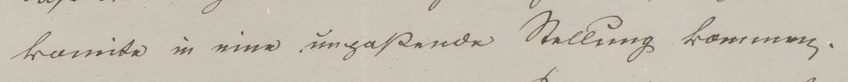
komite in eine unpaßende Stellung kommen.
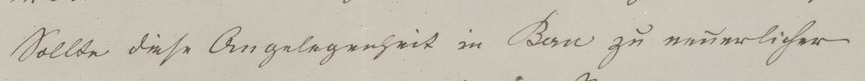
Sollte diese Angelegenheit in Bern zu neuerlicher
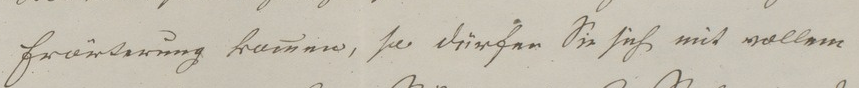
Erörterung kommen, so dürften Sie sich mit vollem
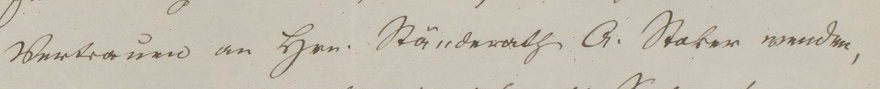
Vertrauen an Hrn. Ständerath A. Stoker wenden,
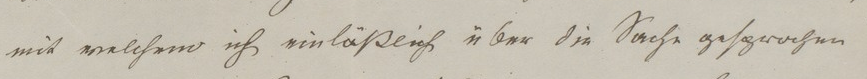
mit welchem ich einläßlich über die Sache gesprochen
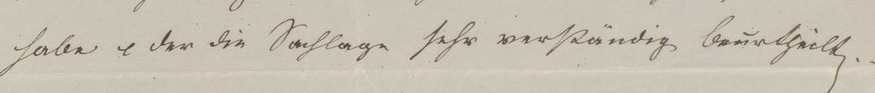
habe & der die Sachlage sehr verständig beurtheilte. –
